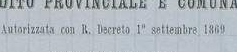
Autorizatta con R. Decreto 1o settembre 1869
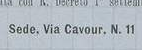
Sede, Via Cavour, N. 11
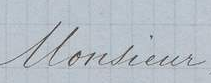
Monsieur,
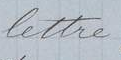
lettre
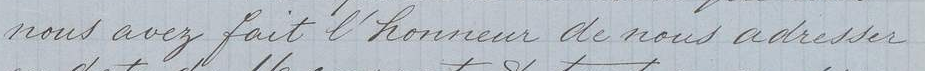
nous avez fait l'honneur de nous adresser
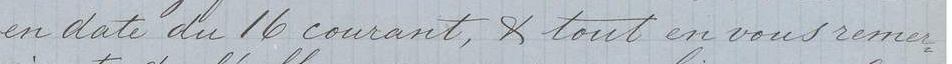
en date du 16 courant, & tout en vous remer-
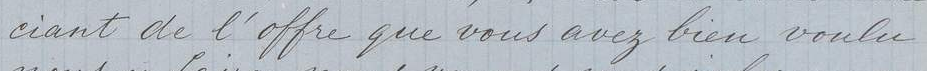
ciant de l'offre que vous avez bien voulu
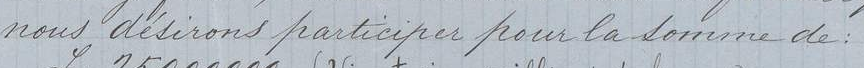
nous désirons participer pour la somme de:
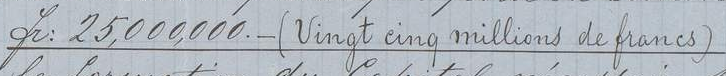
fr. 25,000,000.– (Vingt cinq millions de francs)
